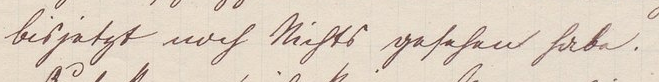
bis jetzt noch Nichts gesehen habe.
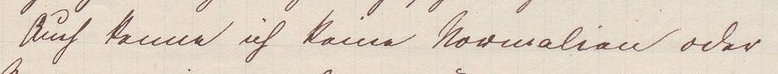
Auch kenne ich keine Normalien oder
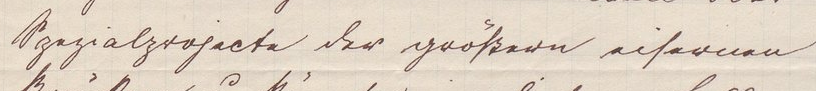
Spezialprojecte der größern eisernen
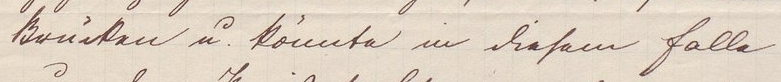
Brücken u. könnte in diesem Falle
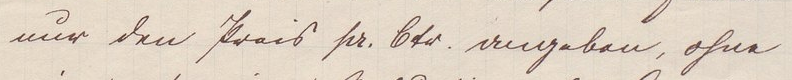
nur den Preis pr. Ctr. angeben, ohne
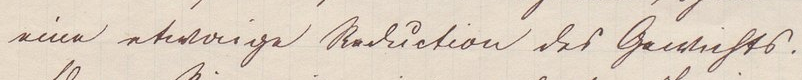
eine etwaige Reduction des Gewichts.
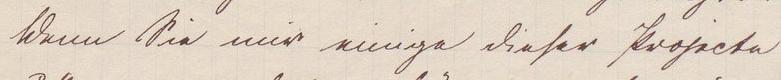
Wenn Sie mir einige dieser Projecte
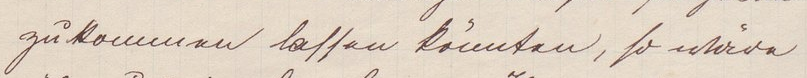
zukommen lassen könnten, so wäre
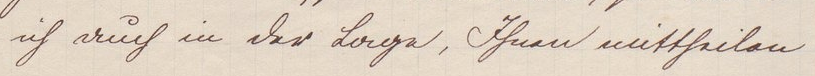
ich auch in der Lage, Ihnen mittheilen
